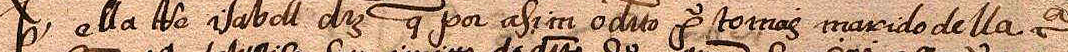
P ella Re isabell dīz q̄ por asim o dito po tomas marido della ca
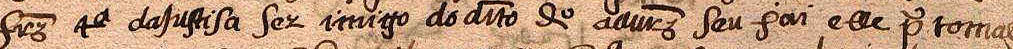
fr̄z ta da Justisa ser imigo do dito dio allur̄z seu pai elle po tomas
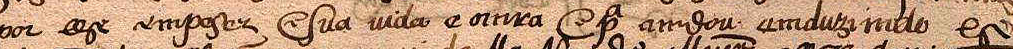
por lhe empeser ē sua uida e omra ē pa amdou emduzimdo he
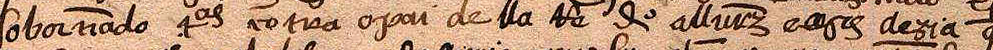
soborn̄ado tas c̄otra o pai della Re dio allur̄z e lhes dezia q̄
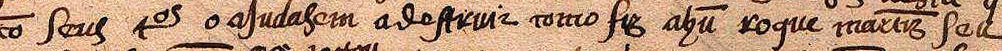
c̄o seus tos o aJudasem a destruir como fez a hū roque mar̄tiz seu
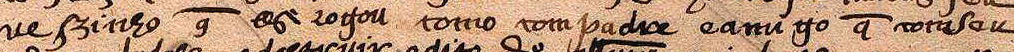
ueszinho q̄ lhe rogou como compadre e amigo q̄ com seu
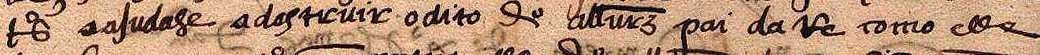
tos o aJudase a destruir o dito dio allūrz pai da Re como elle
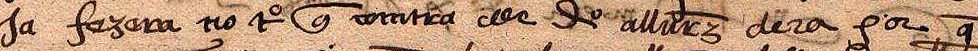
Ja fezera no to q̄ comtra elle dio allūrz dera por q̄
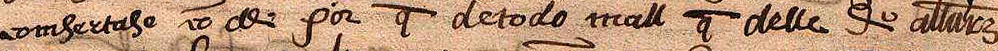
comsertase c̄o elle por q̄ de todo mall q̄ delle dio āllurz
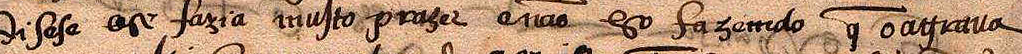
disese lhe fazia muJto prazer e não ho fazemdo q̄ o agraua
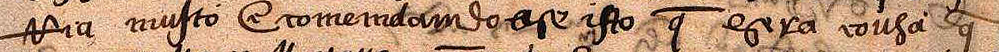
Ria mJto ēcomemdamdolhe isto q̄ hera cousa q̄
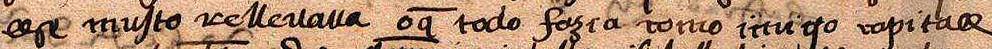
lhe muJto relleuaua o q̄ todo fazia como imigo capitall
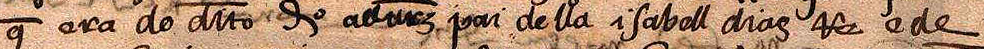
q̄ era do dito dio all̄urz pai della isabell dias Re e de
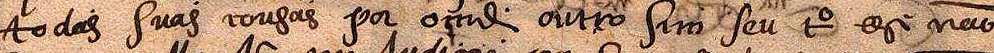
todas suas cousas por omde outro sim seu to lhe não
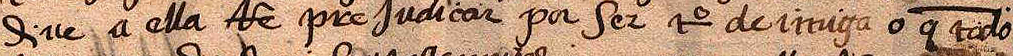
deue a ella Re preJudicar por ser to de imiga o q̄ todo
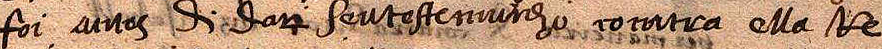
foi antes de dar seu testemunho comtra ella Re
